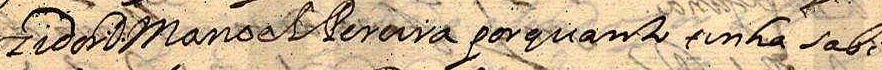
zidor D. Manoel Pereira porquanto tinha sabi
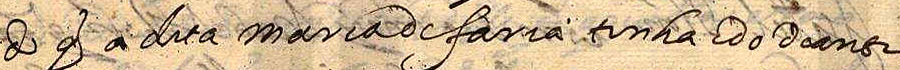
do q̄ a dita maria de faria tinha ido diante
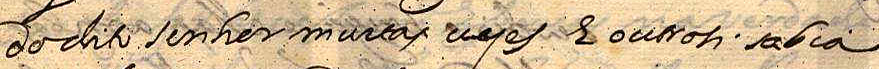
do dito senhor muitas uezes E outrosi sabia
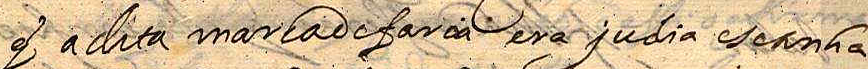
q̄ a dita maria de faria era judia e se tinha
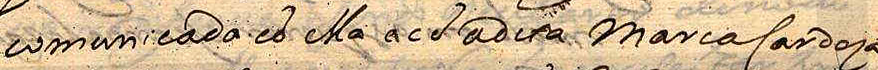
comunicado cō ella e cō a dita Maria Cardoza
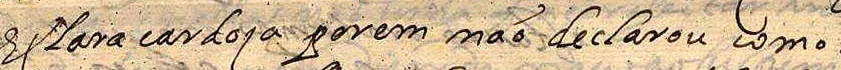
E Clara cardoza porem naõ declarou como
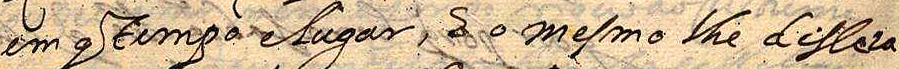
em q̄ tempo e lugar, E o mesmo lhe disseraõ
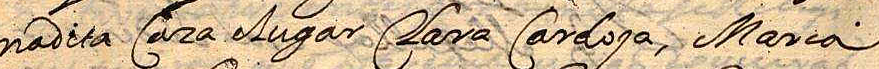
na dita Caza e lugar Clara Cardoza, Maria
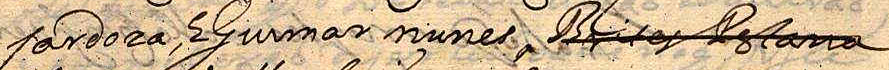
Cardoza, E Guimar nunes, Brites Pestana
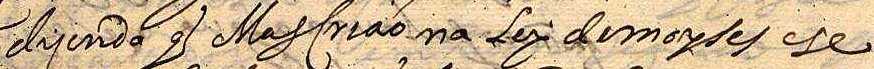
dizendo q̄ ellas Criaõ na Ley de moyses e se
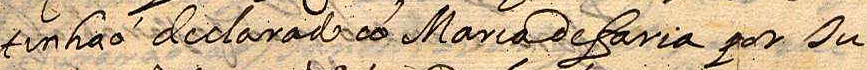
tinhaõ declarado cō Maria de faria por Iu
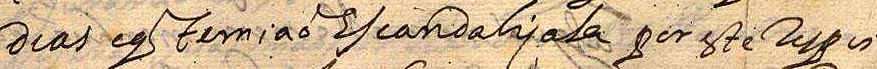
dias e q̄ temiaõ Escandalizala per este Respei
